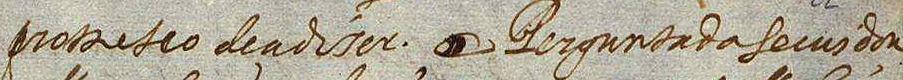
prometeo de a diser. ⁋ Perguntada se cuidou
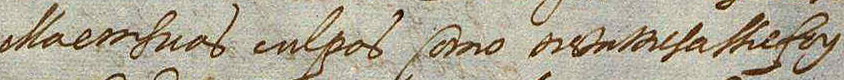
ella em suas culpas Como nesta mesa lhe foy
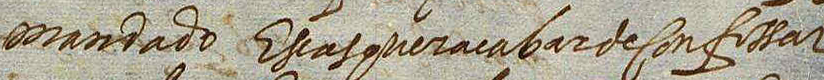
mandado E se as quer acabar de Confessar
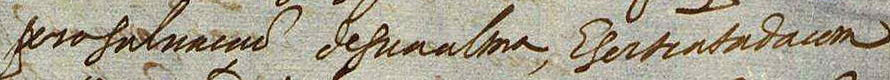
pera saluaçaõ de sua alma, E ser tratada com
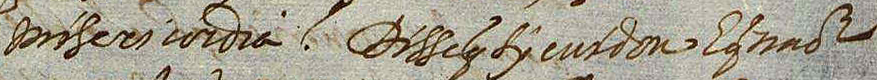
misericordia? Disse q̄ sy cuidou E q̄ naõ
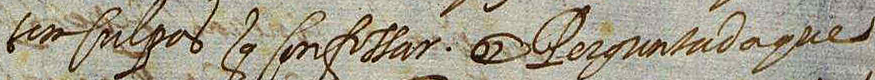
tem Culpas q̄ Confessar. ⁋ Perguntada que
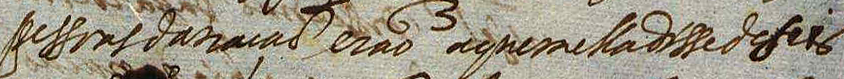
pessoas da naçaõ eraõ a quem ella disse de seis
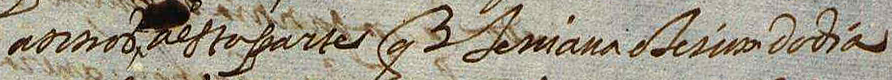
annos, a esta parte q̄ Jeiuaua o Ieium do dia
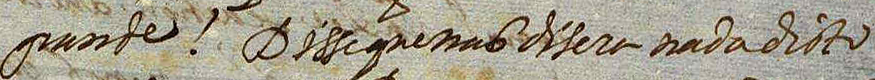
grande? Disse que naõ disera nada disto
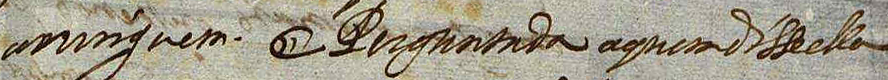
a ninguem. ⁋ Perguntada a quem disse ella
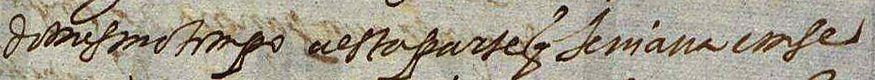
do mesmo tempo a esta parte q̄ Ieiuaua em se
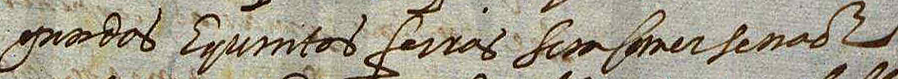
gundas E quintas feiras sem Comer senaõ
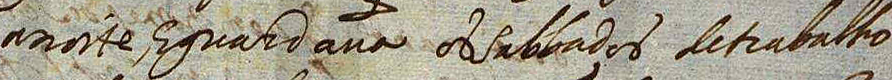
a noite, E guardaua os sabbados de trabalho
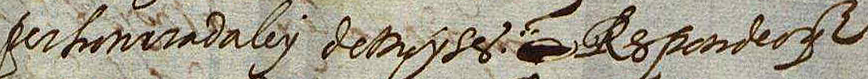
per honrra da ley de moyses? Respondeo q̄
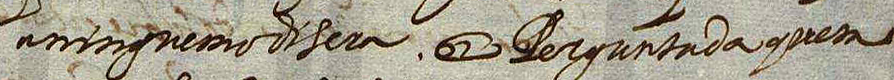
a ninguem o disera. ⁋ Perguntada quem
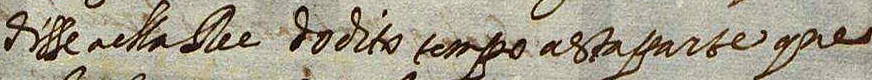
disse a ella Ree do dito tempo a esta parte que
